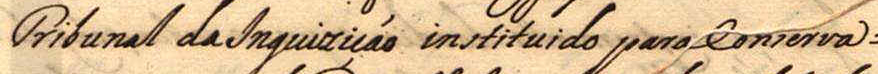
Tribunal da Inquizição instituido para Conserva
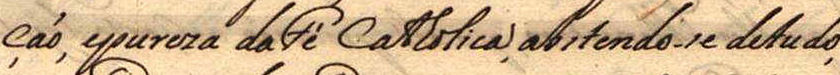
çaõ, e pureza da Fé Catholica, abstendo-se de tudo,
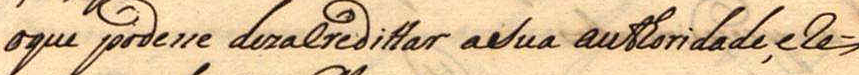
o que podesse dezacredittar a sua authoridade, e Re
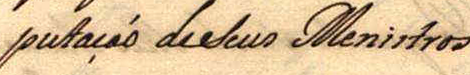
putaçaõ de Seus Menistros
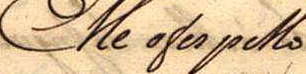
Elle o fes pello
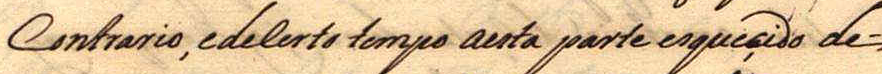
Contrario, e de certo tempo a esta parte esqueçido de
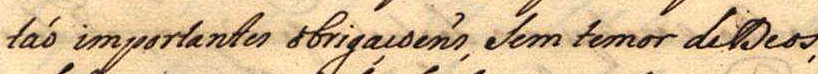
taõ importantes obrigaçoen̄s, Sem temor de Deos,
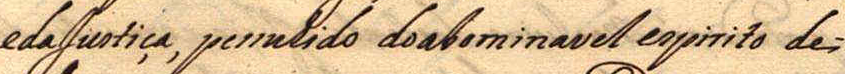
e da Justiça, pessuhido do abominavel espirito de
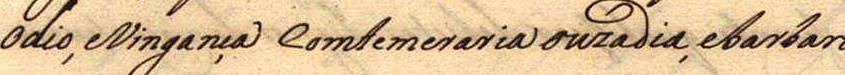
odio, e Vingança Com temeraria ouzadia, e barbaro
